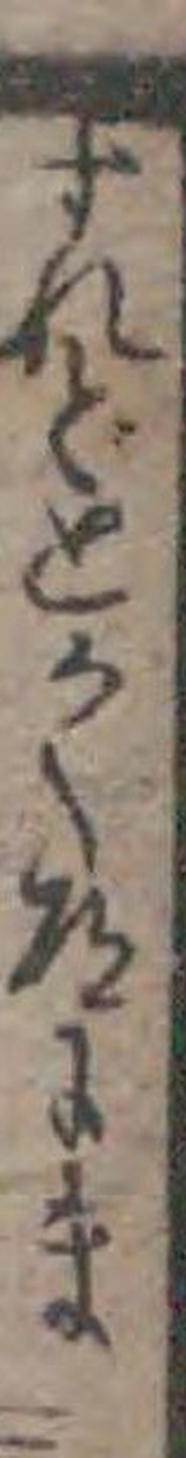すれどとかく道にま
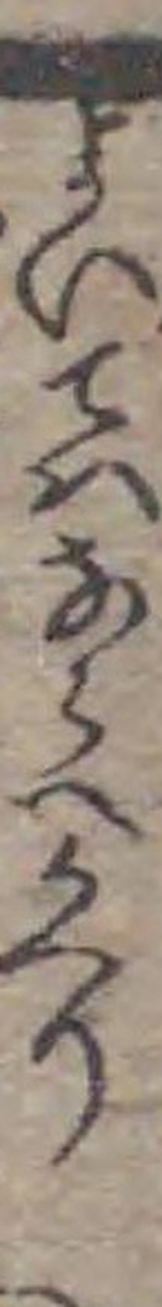よいてはならへかへり
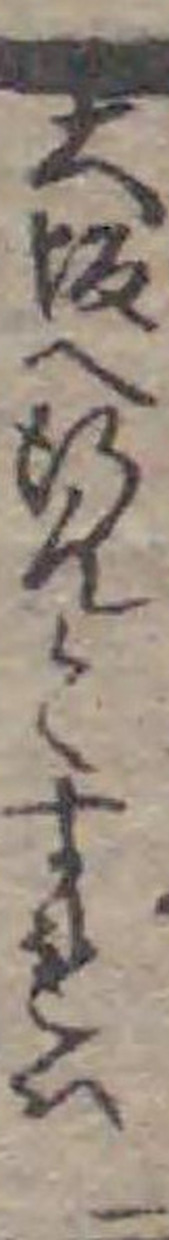大坂へ行んとすれは
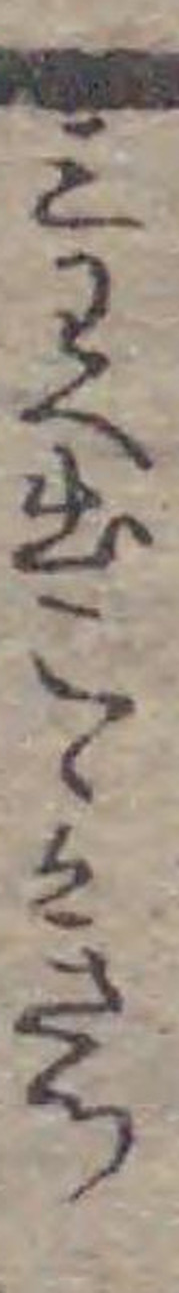三わへ出こゝかきつ
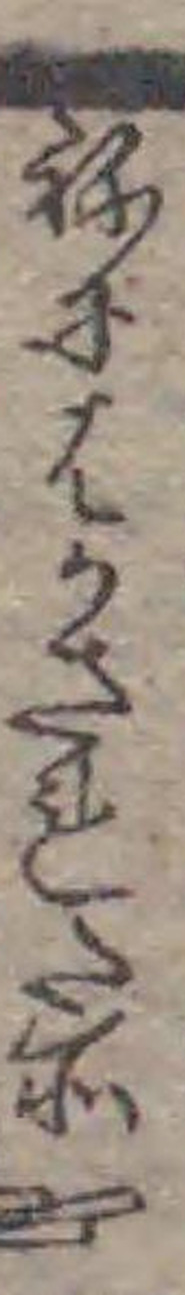ねにはかされた所
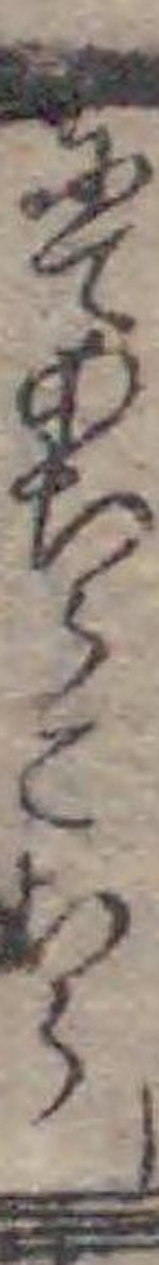にてあちらこちら
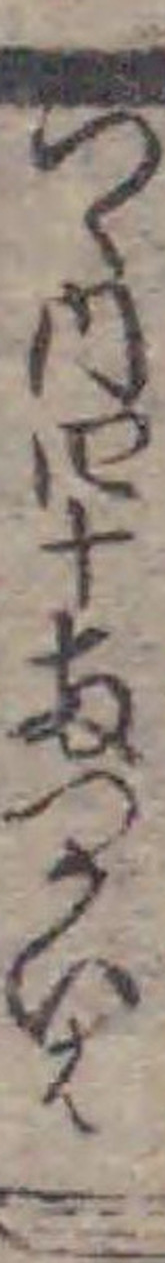つく内四十両つかいは
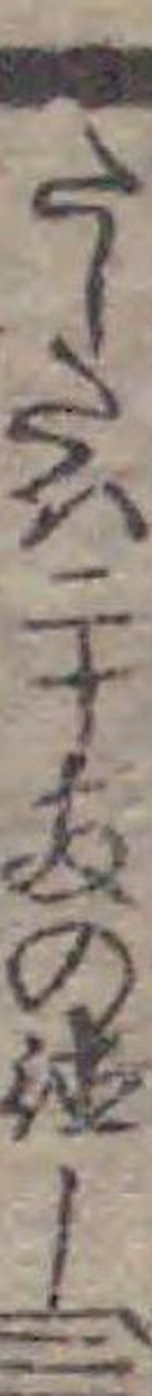たしたは二十両の徳
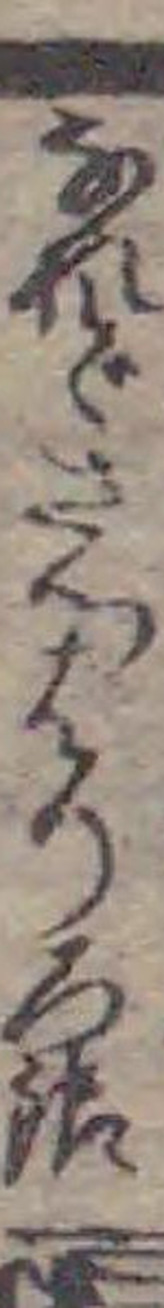なれどさつはりろ銀
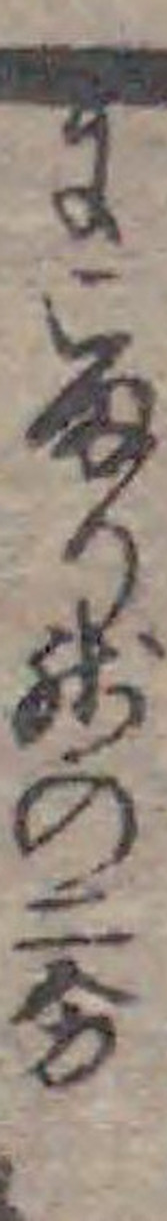にこまり残の二分
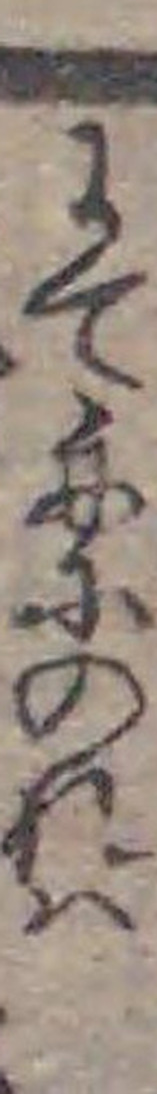にて舟にのれは
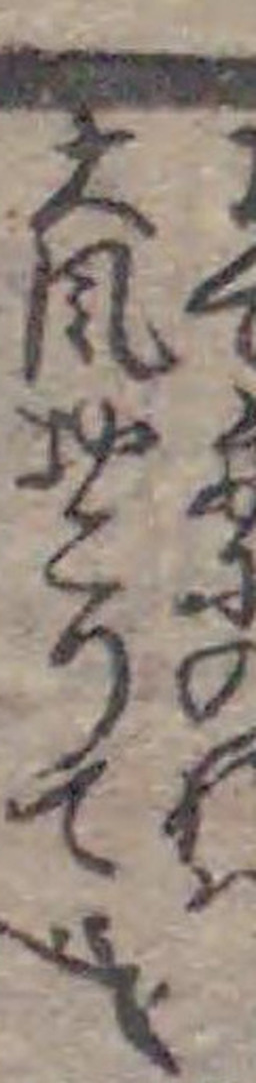大風おこりて
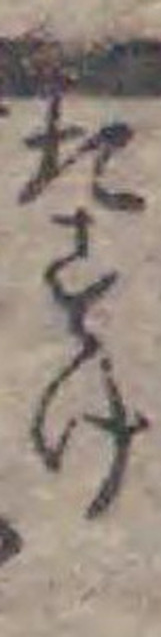たすけ
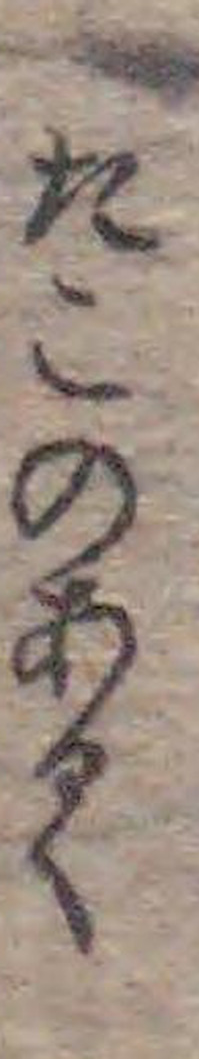たこのあるく
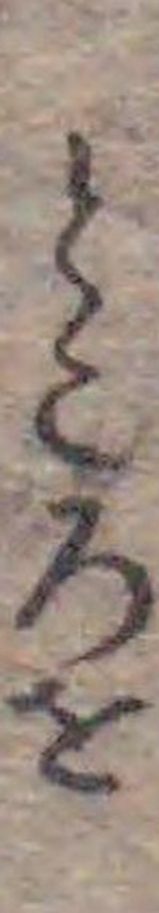ところを

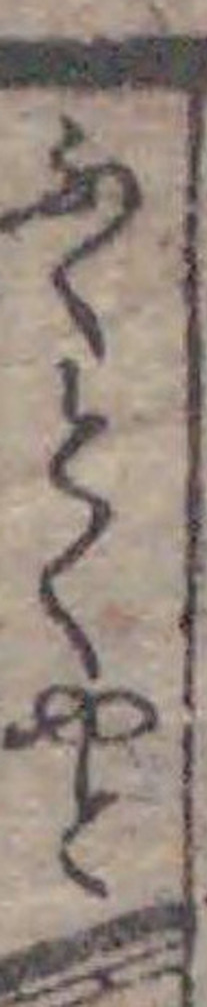ふくとくやと
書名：紺屋百物語 : 3巻
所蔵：国立国会図書館 National Diet Library, JAPAN
